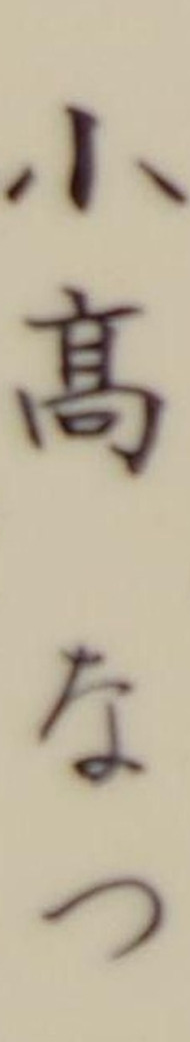小高なつ
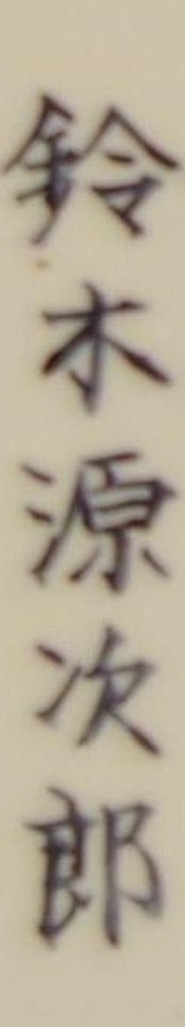鈴木源次郎
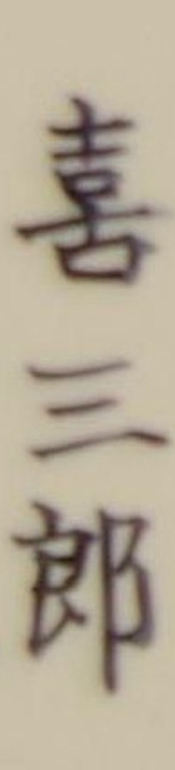喜三郎

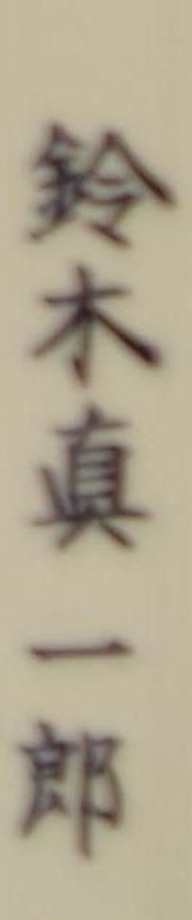鈴木真一郎
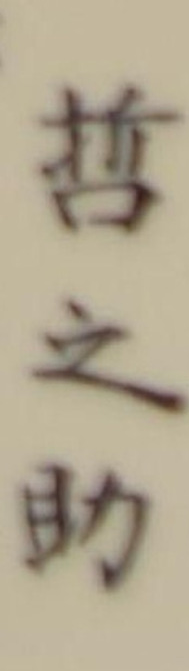哲之助
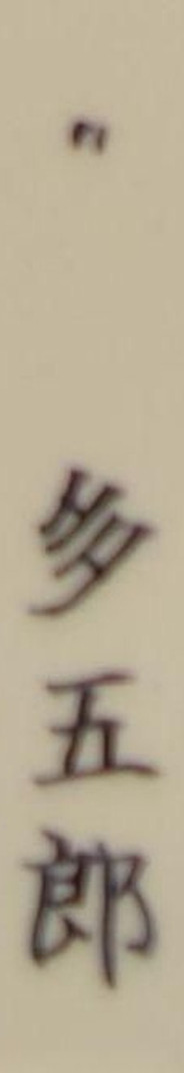多五郎
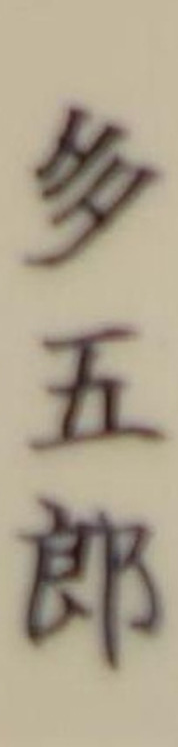多五郎
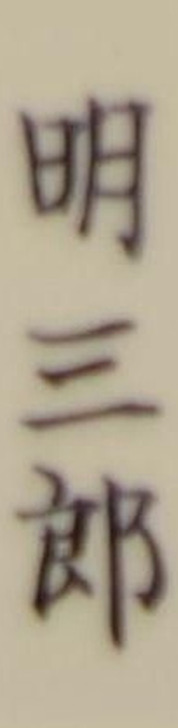明三郎
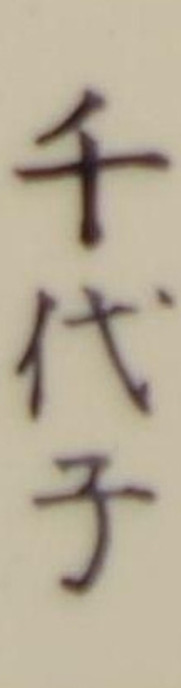千代子
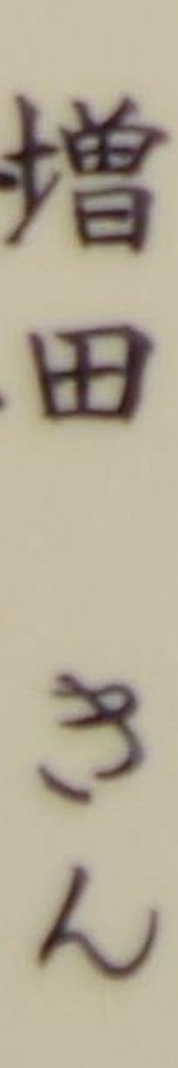増田きん
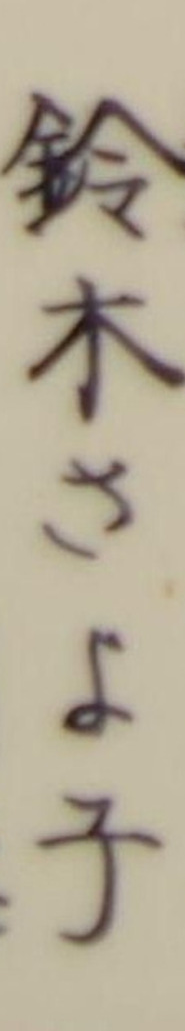鈴木さよ子
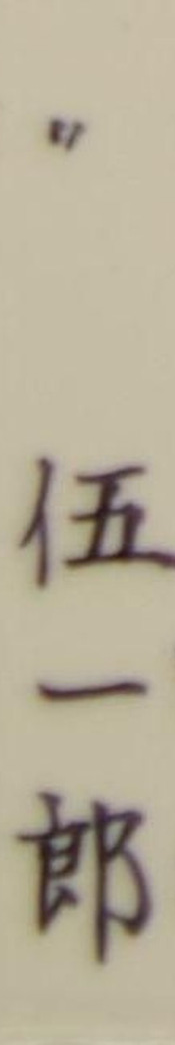伍一郎
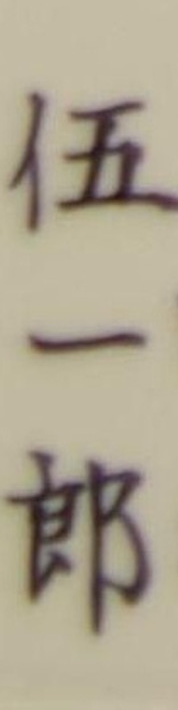伍一郎

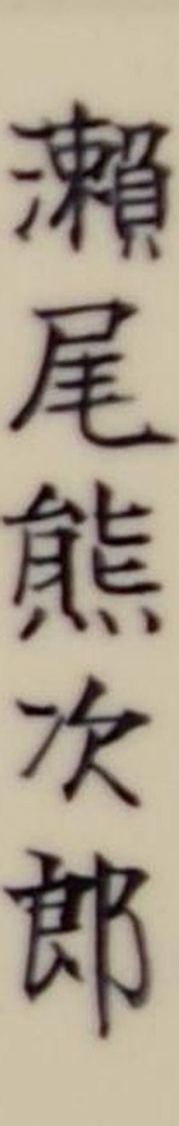瀨尾熊次郎
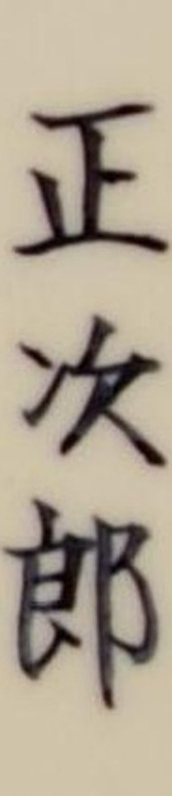正次郎
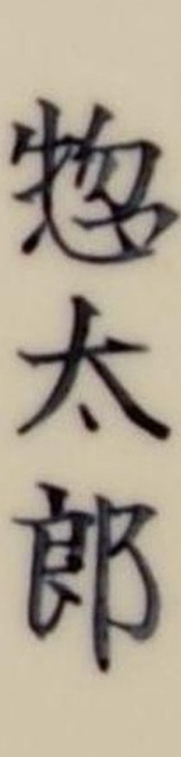惣太郎
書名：A~D
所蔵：koyasan kongobuji
